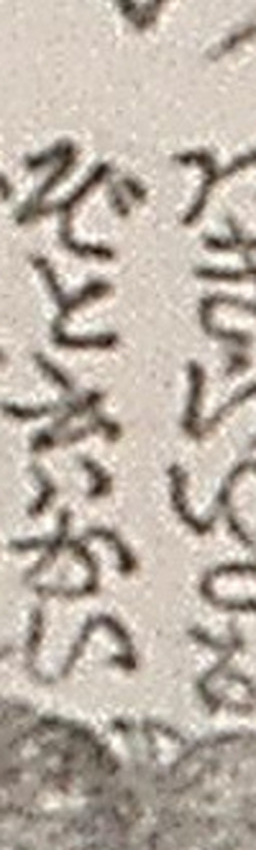ぞといはない
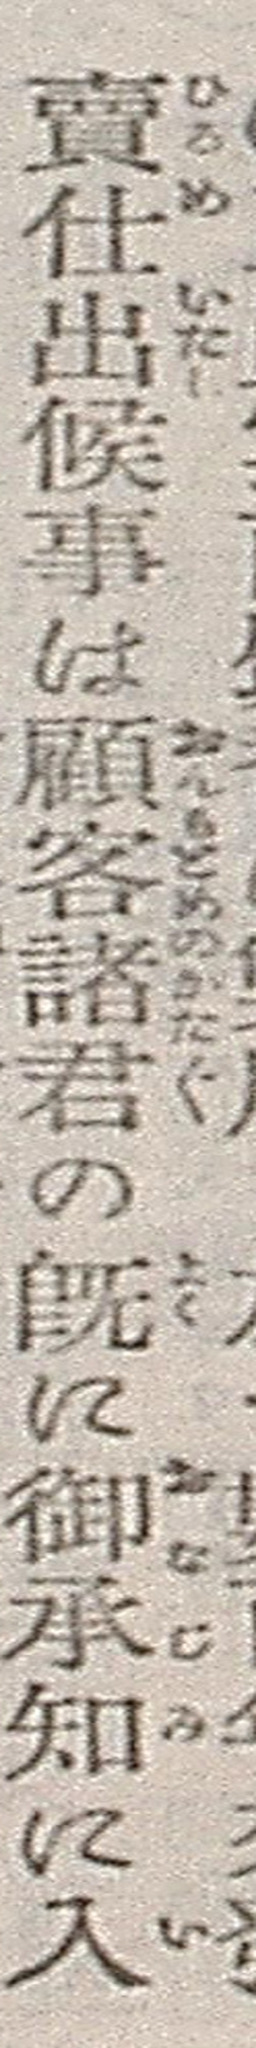売仕出候事は顧客諸君の既に御承知に入
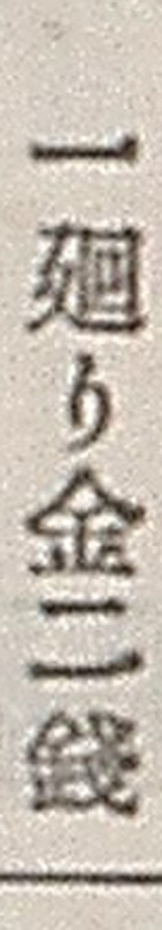一廻り金二銭
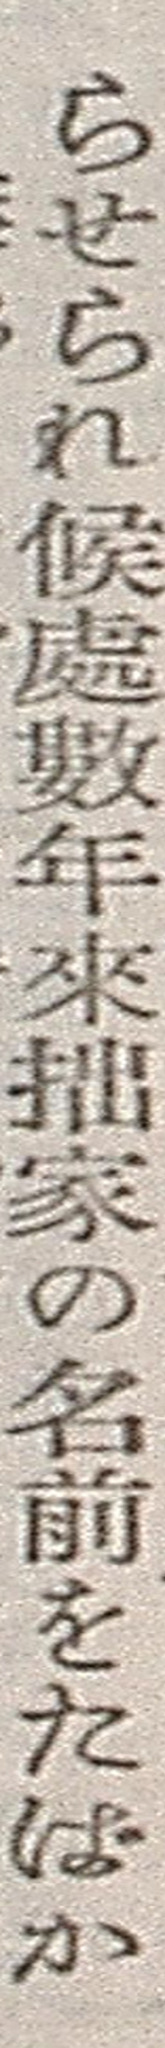らせられ候処数年来拙家の名前をたばか
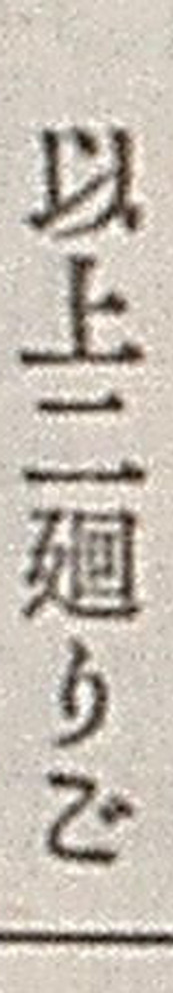以上二廻りぼ
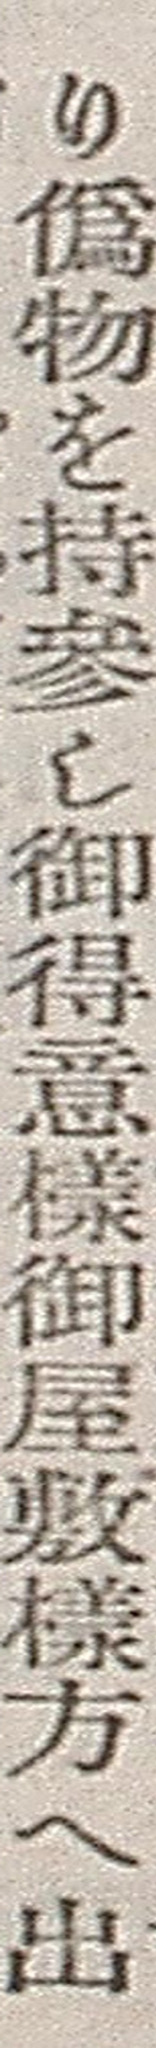り偽物を持参し御得意様御屋敷方へ出
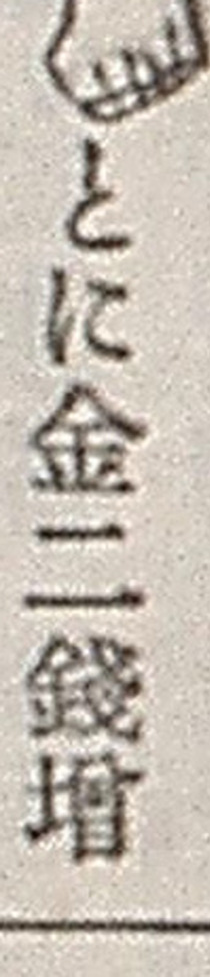とに近二銭増
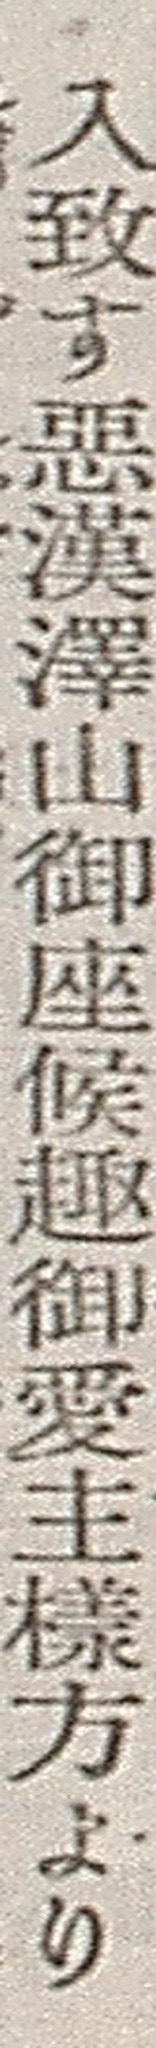入致す悪漢沢山御座候趣御愛主様方より
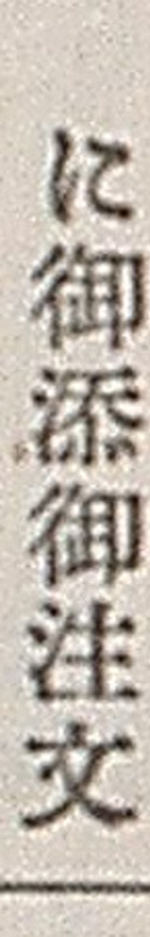に御添御注文
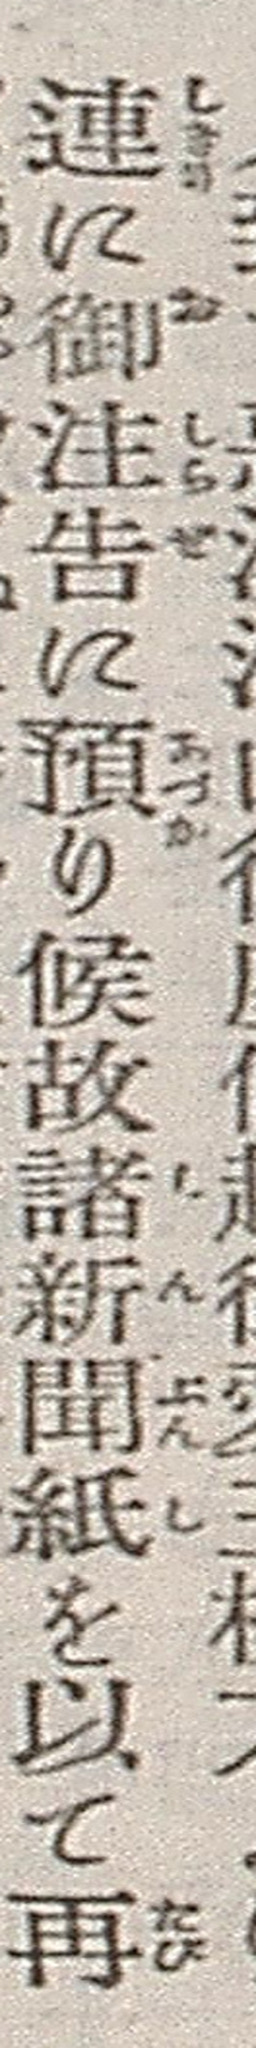連に御注告に預り候故諸新聞を以て再
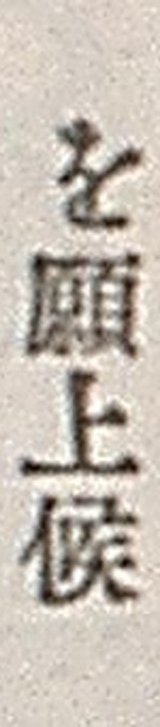を願上候
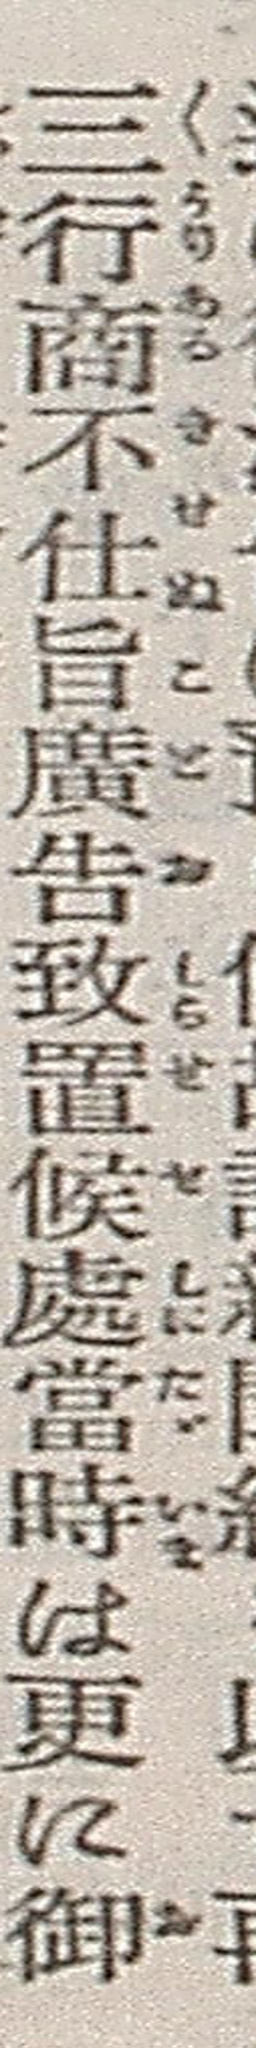三行商不仕旨広告致置候処当時は更に御
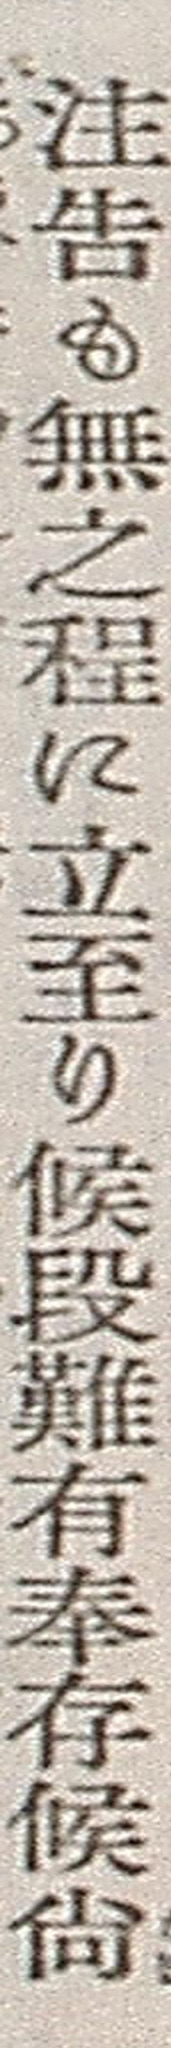注告も無之程に立至り候段難有奉存候尚
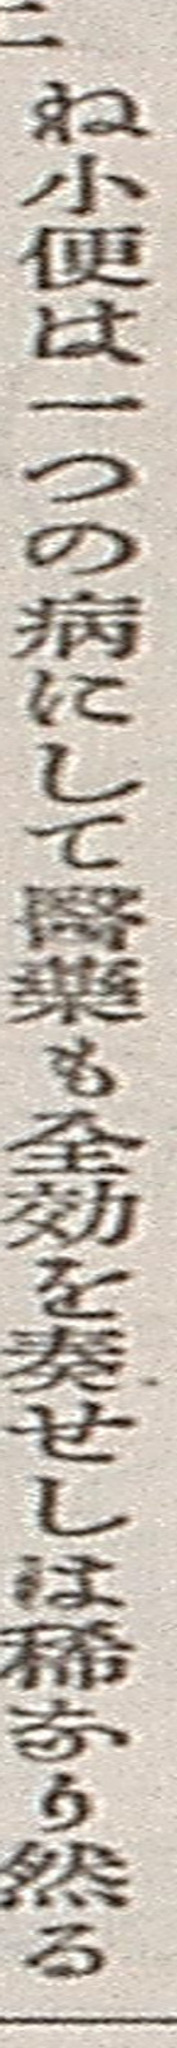主ね小便は一つの病にして医薬も全効を奏せしは稀なり然る
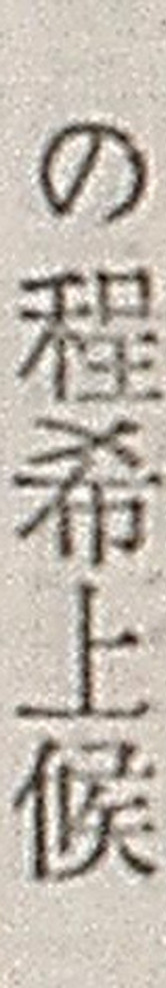の程希上侯
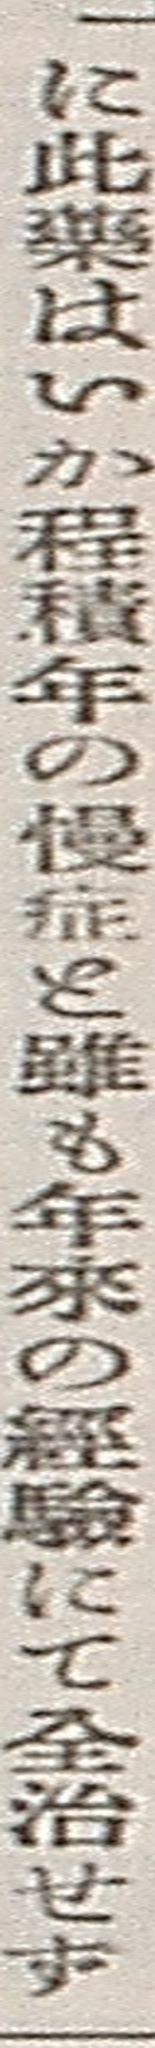に此薬はいか程積年の慢性と雖も年来の経験にて完治せず
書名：風俗畫報臨時増刊第百二十六號　洪水被害録（中）
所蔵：東京大学地震研究所図書室 Earthquake Research Institute Library, The University of Tokyo, JAPAN
